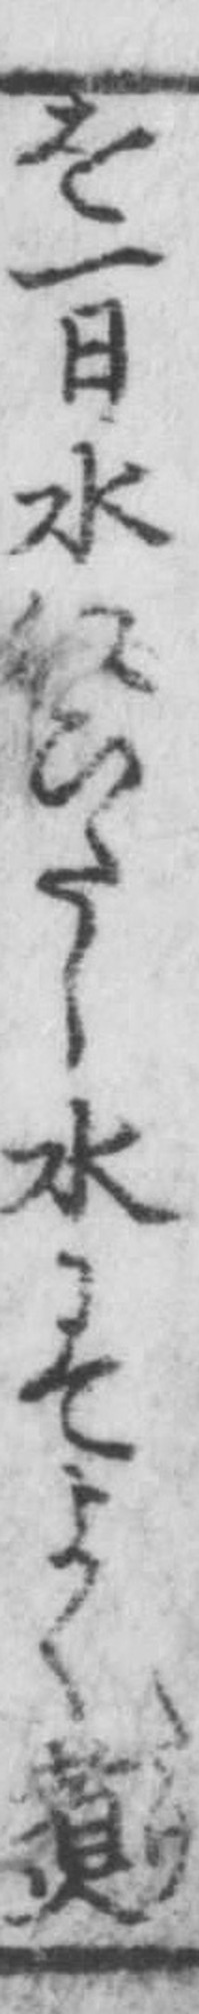を一日水にひたし水にてよく煮
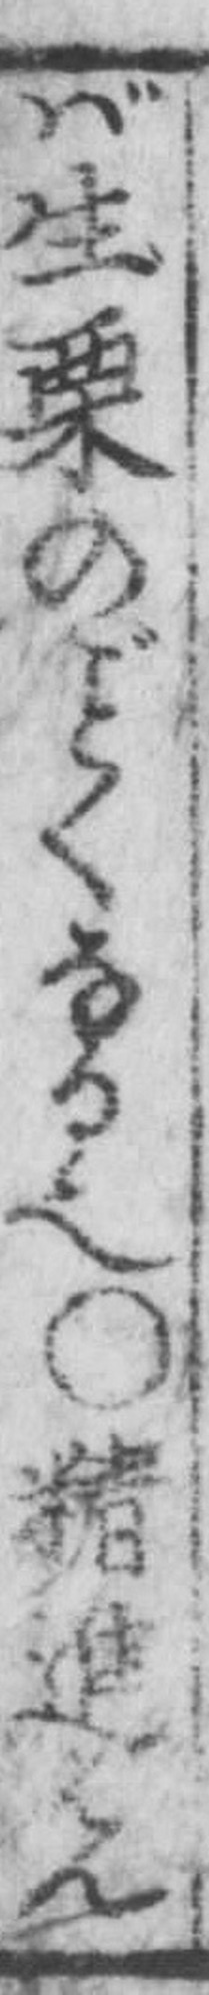バ生栗のごとくなる也〇精進ばん
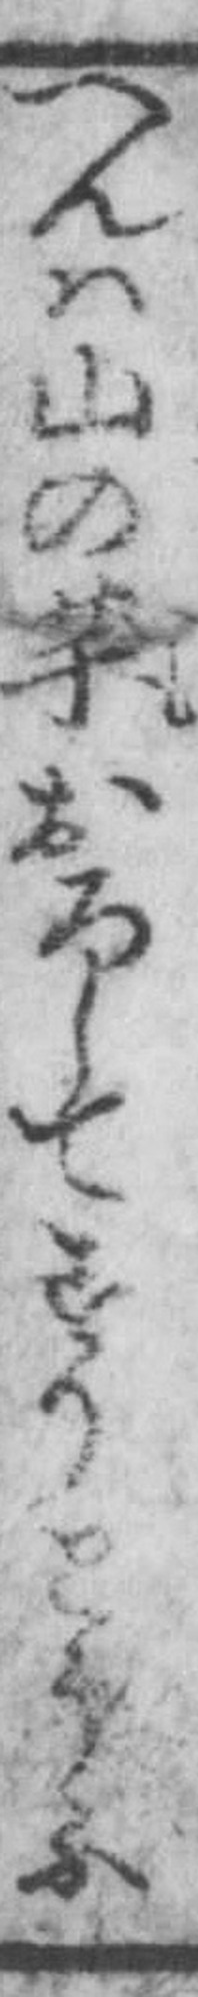へんハ山のいもおろしてすりとうふ

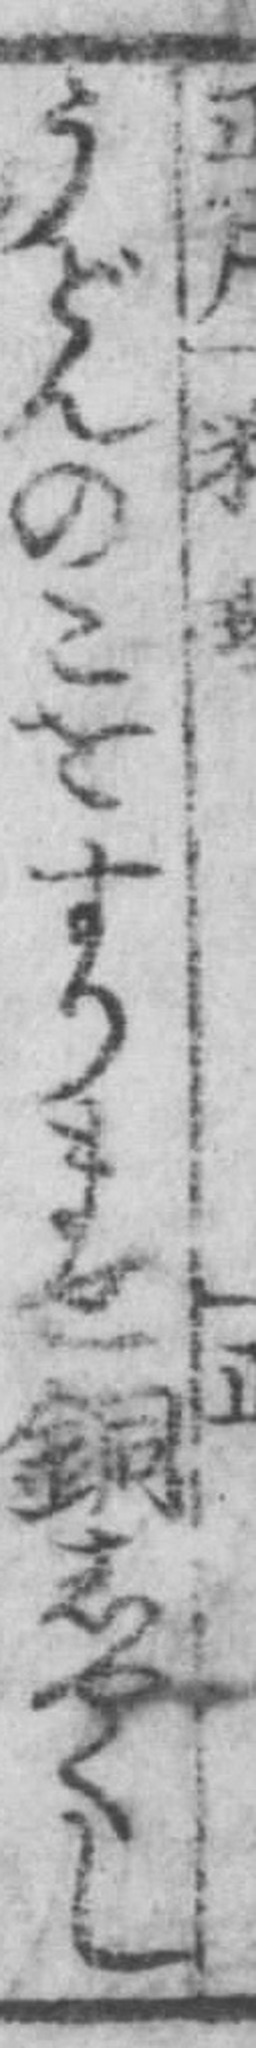うどんの子をすりませ銅しやくし
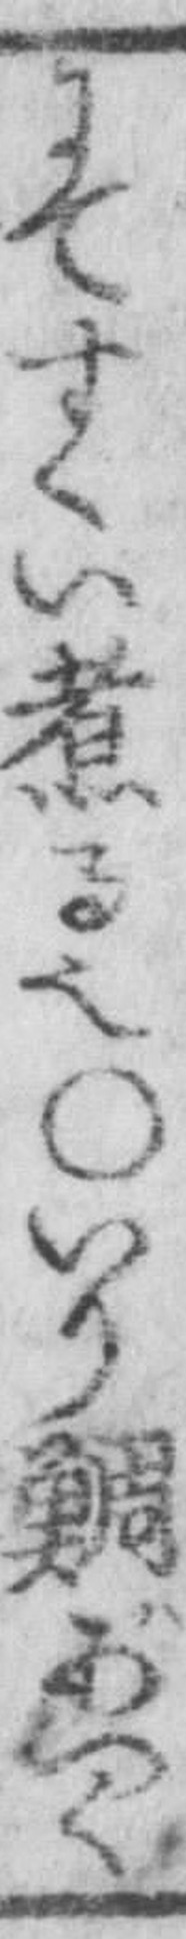にてすくい煮る也〇いり鯛あつく
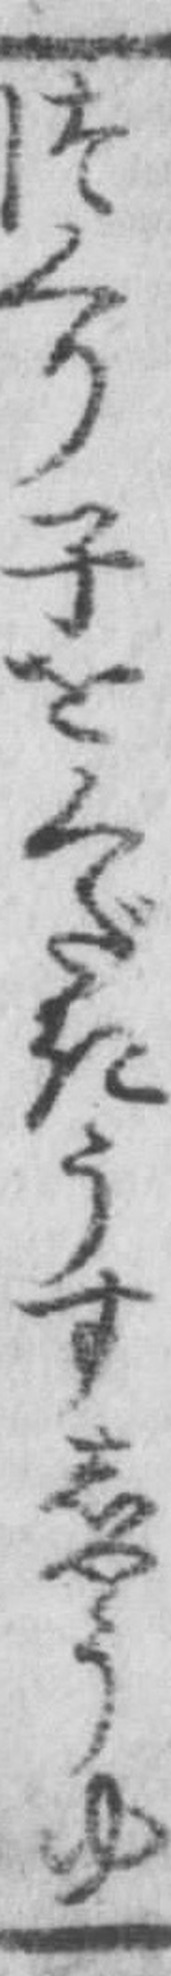つくり子をくだきうすしやうゆ
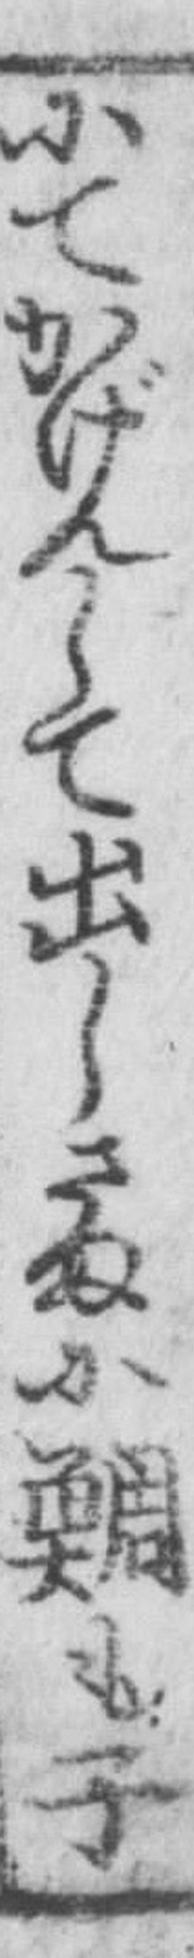にてかげんして出しか鯛も子
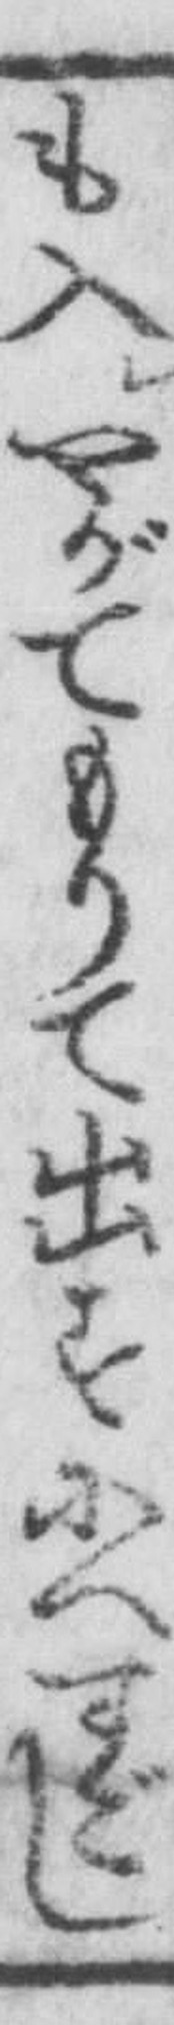も入やがてもりて出すにへすごし
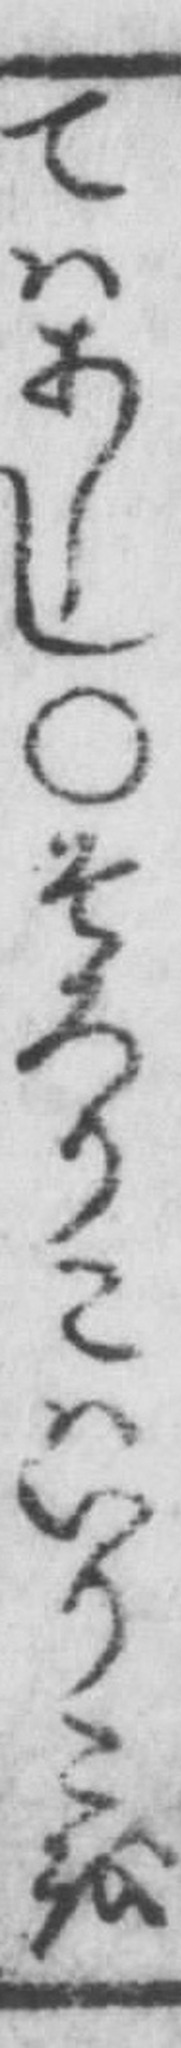てハあし〇そろりこハいりこを
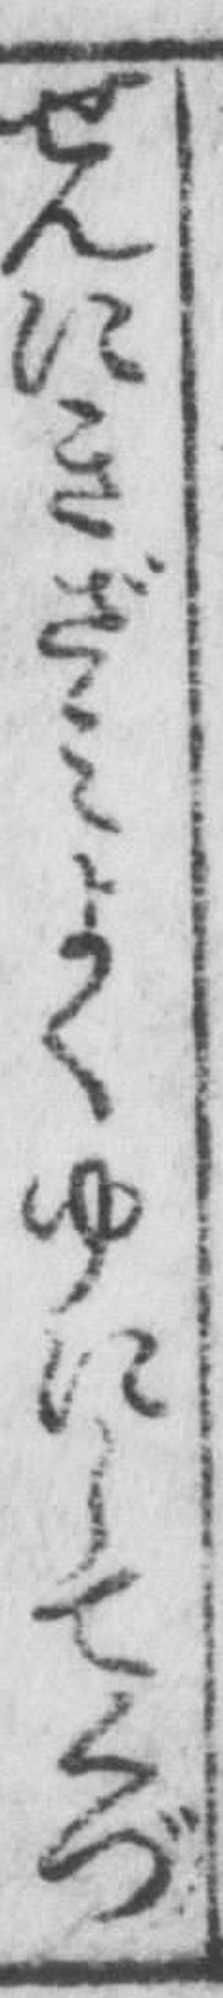せんにきざミよくゆにしてくづ
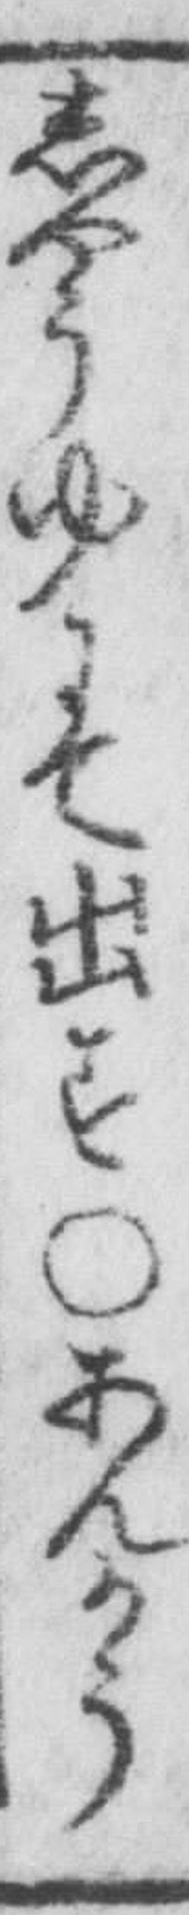しやうゆにて出す〇あんかう
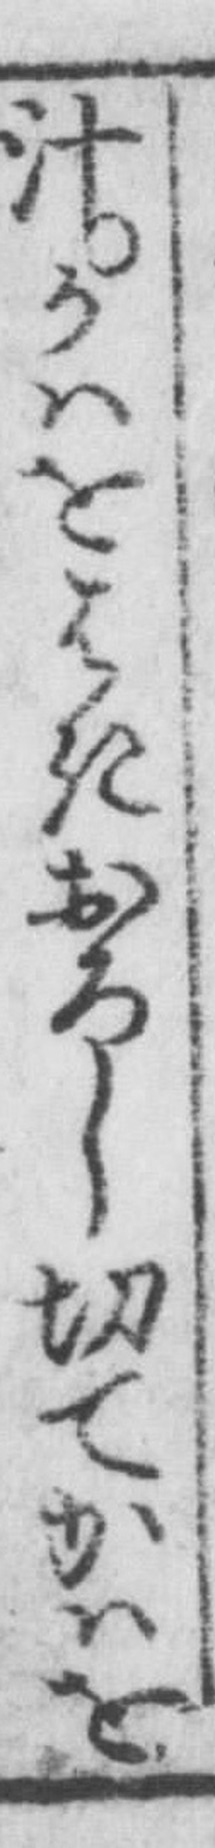汁。かハをはきおろし切てかハを
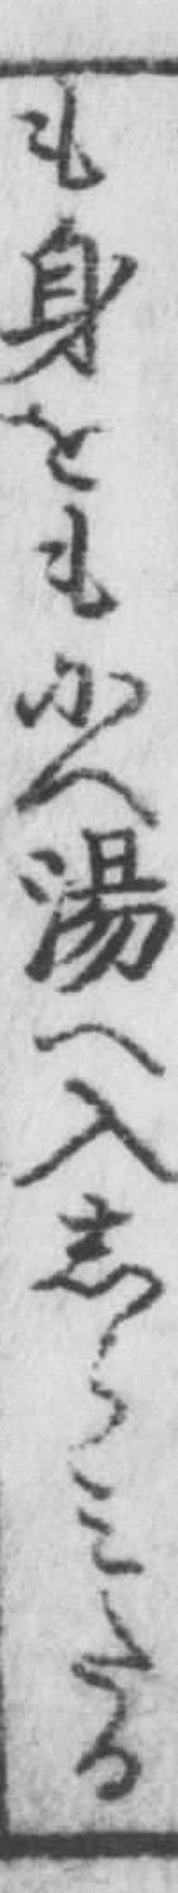も身をもにへ湯へ入れしらミたる
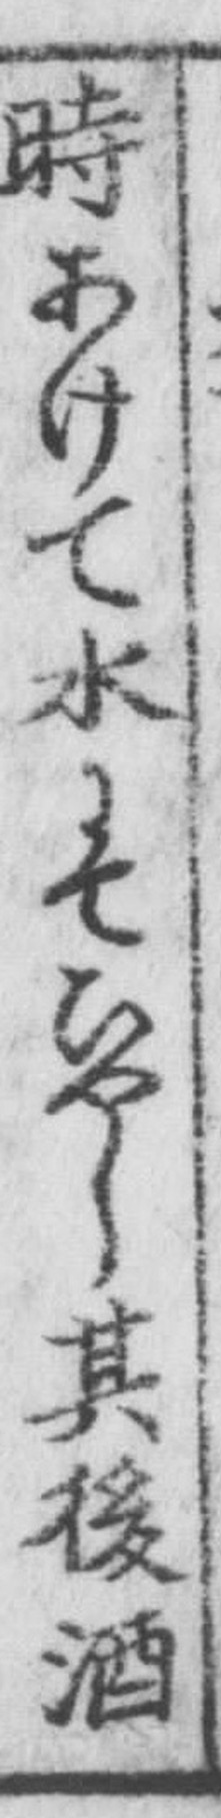時あけて水にてひや其の後酒
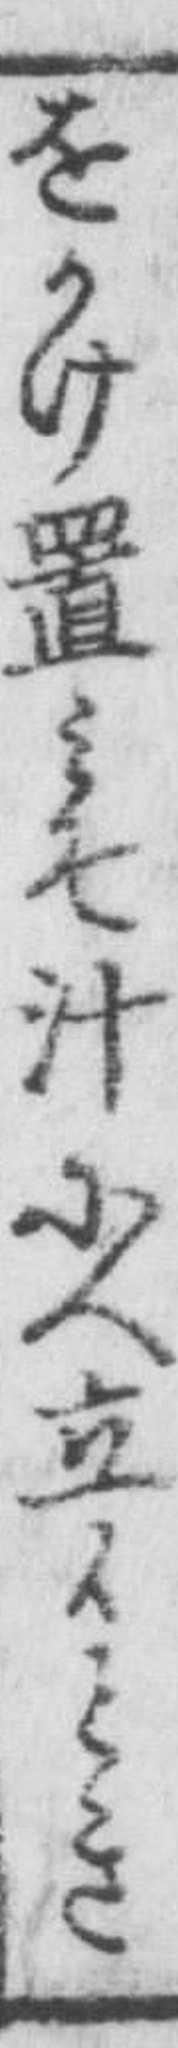をかけ置きミそ汁にへ立んとき
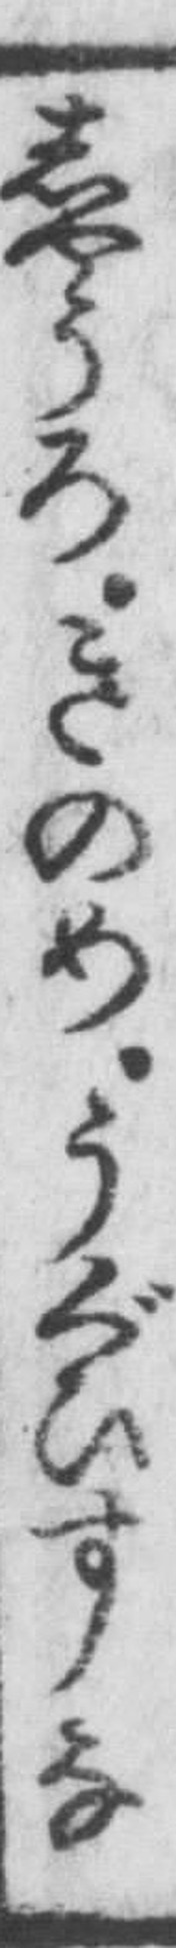しやうろきのめうぐひすな
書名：当世料理筌
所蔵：大阪府立大学学術情報センター 国文学研究資料館
